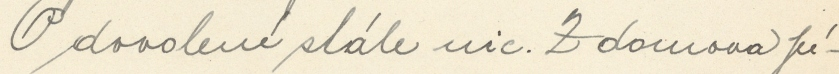O dovolené stále nic. Z domova pí-
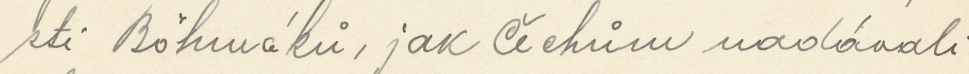sti Böhmáků, jak Čechům nadávali.
